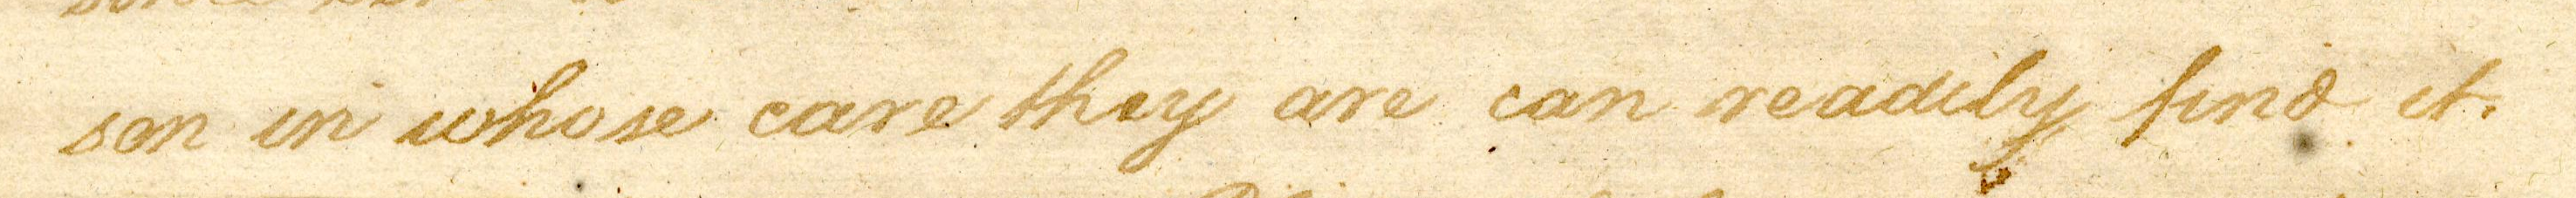son in whose care they are can readily find it.
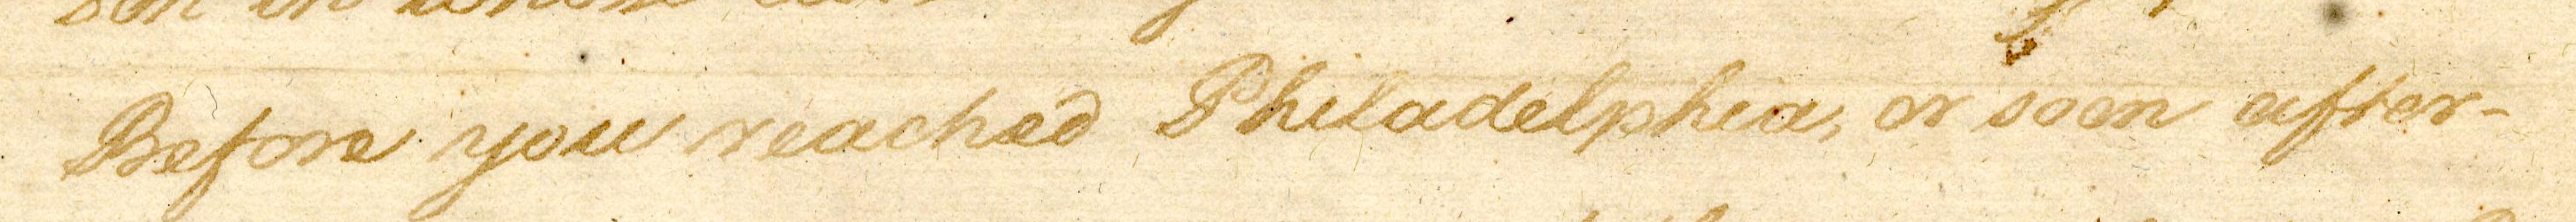Before you reached Philadelphia, or soon after-
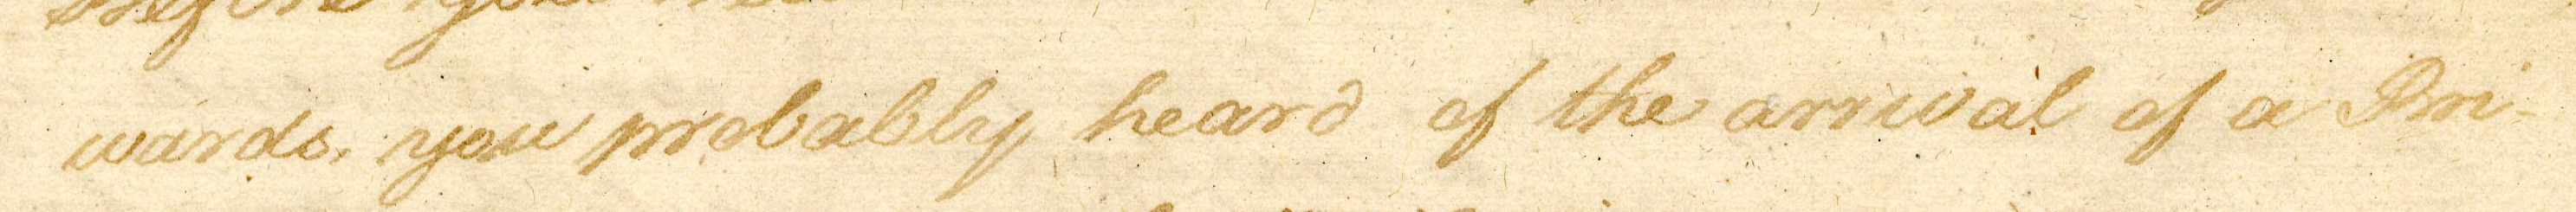wards you probably heard of the arrival of a Bri-
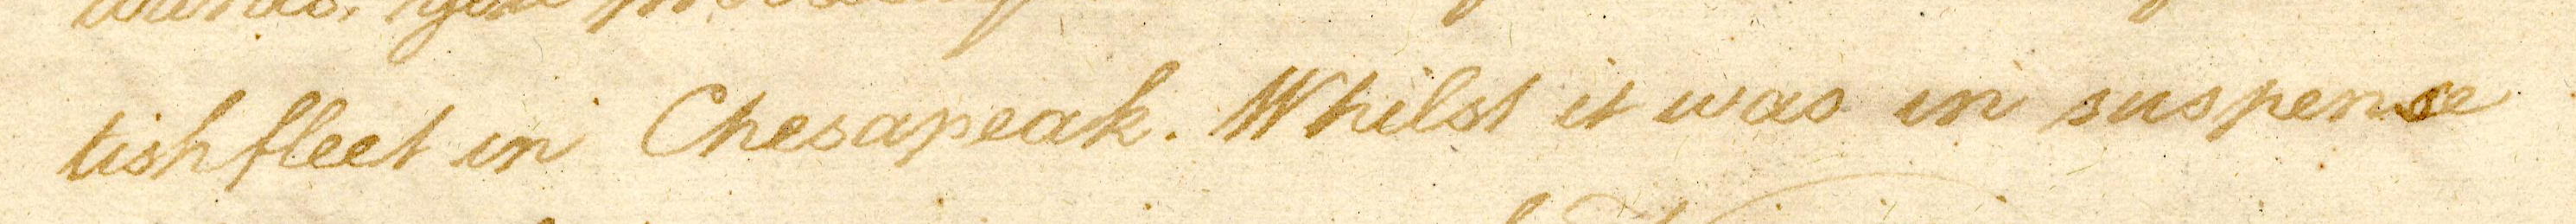tish fleet in Chesapeak. Whilst it was in suspense
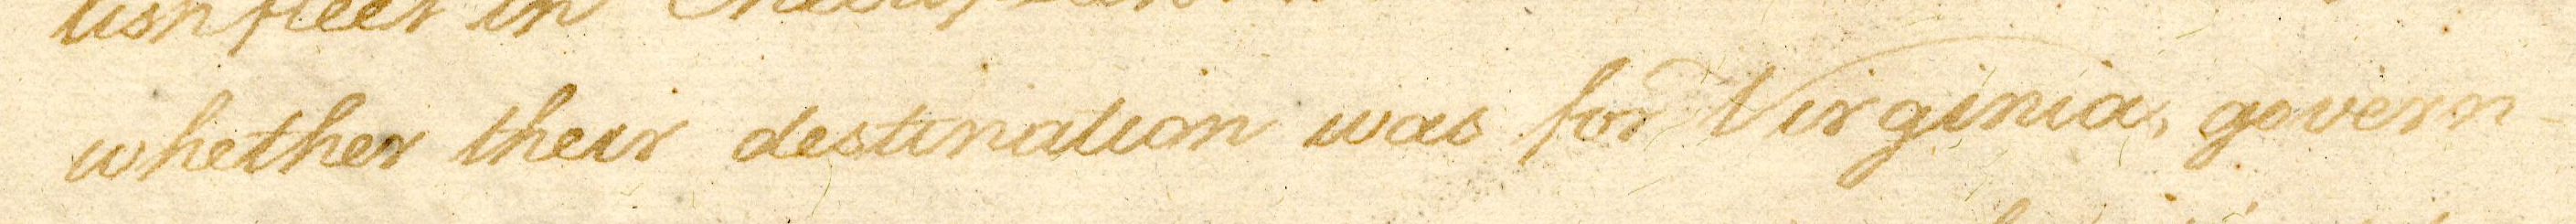whether their destination was for Virginia govern
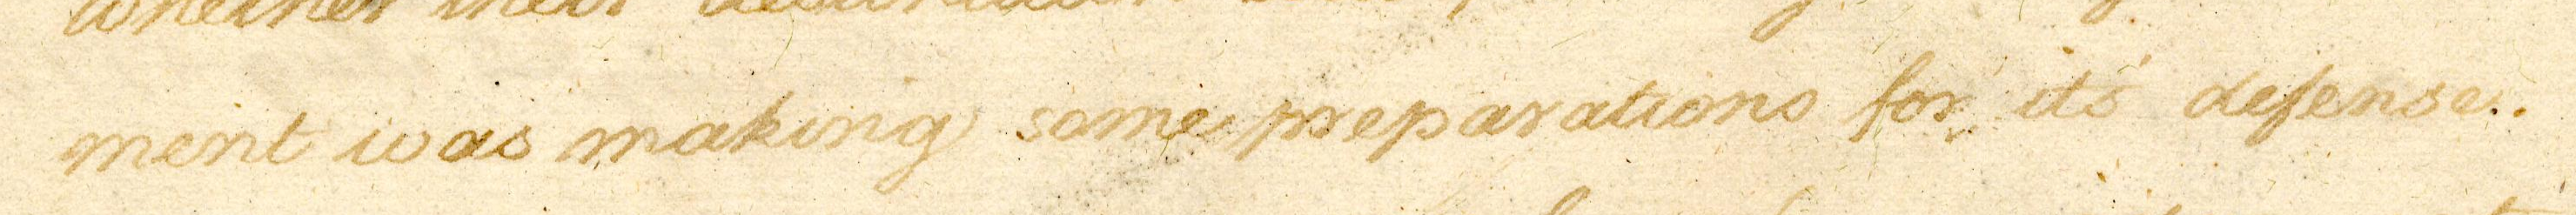ment was making some preparations for its defense.
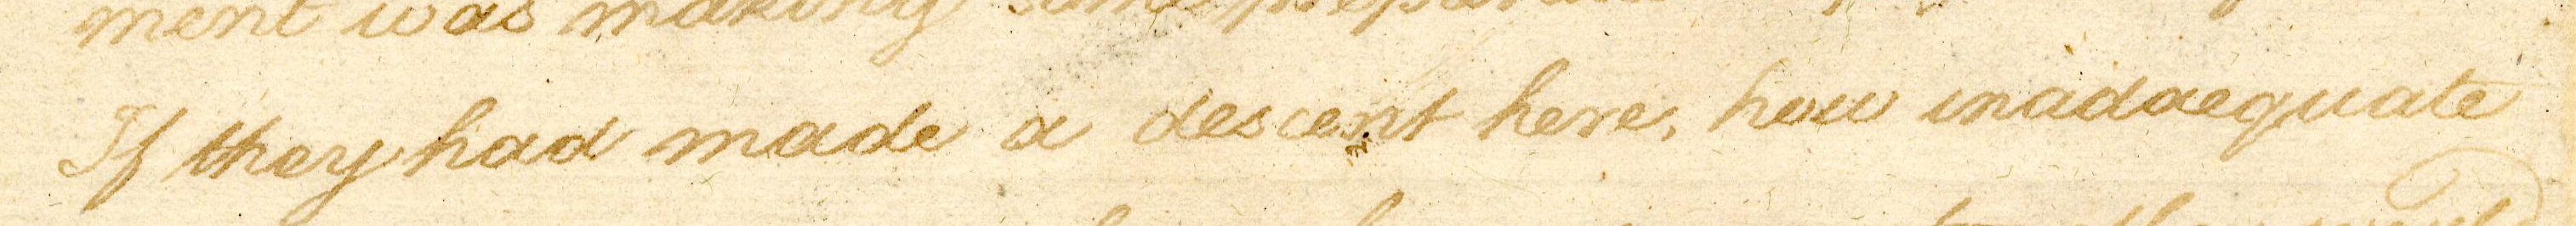If they had made a descent here, how inadequate
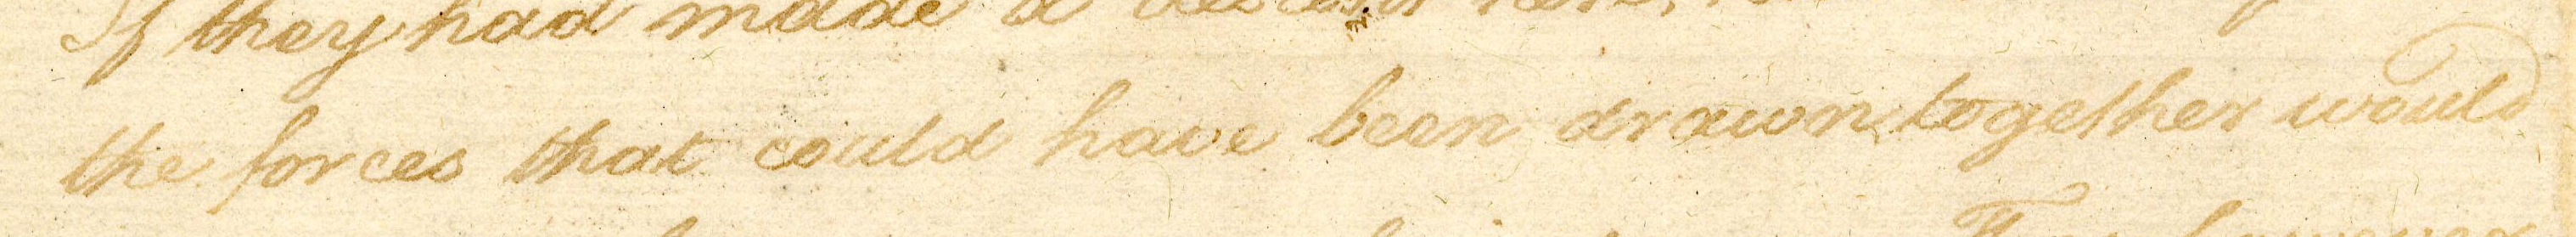the forces that could have been drawn together would
